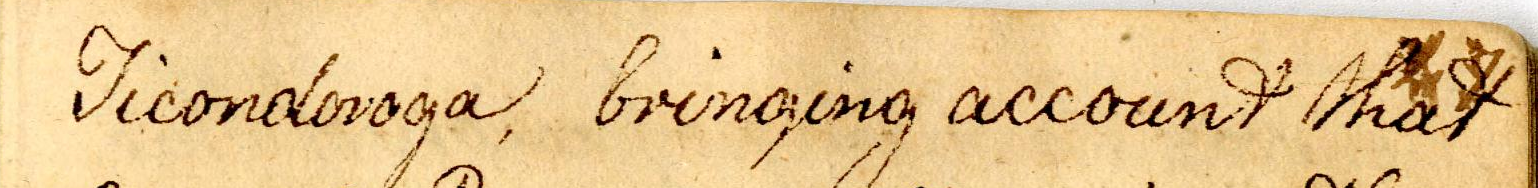Ticondoroga, bringing account that
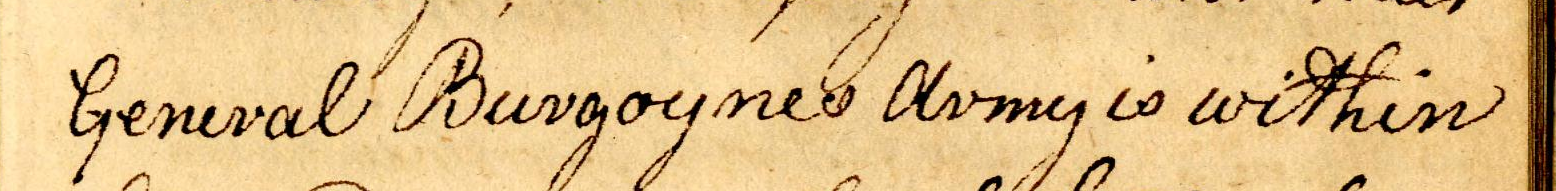General Burgoynes Army is within
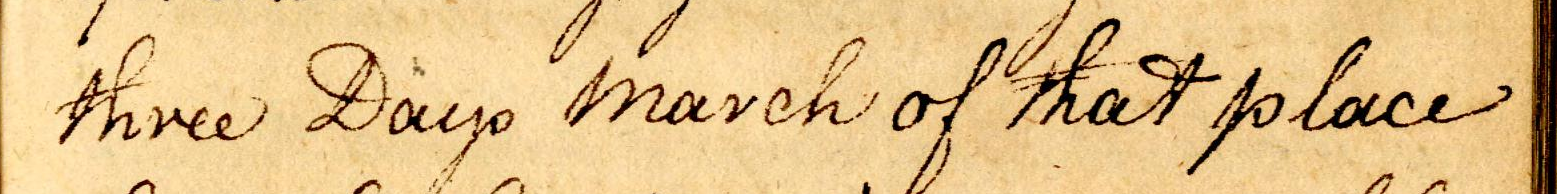three Days March of that place
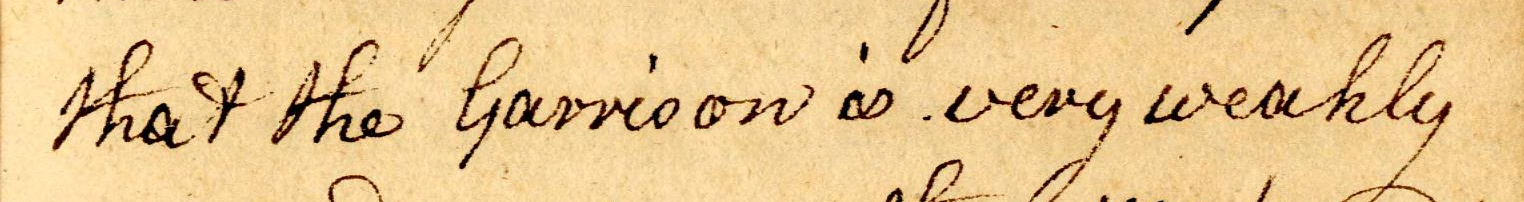that the Garrison is very weakly
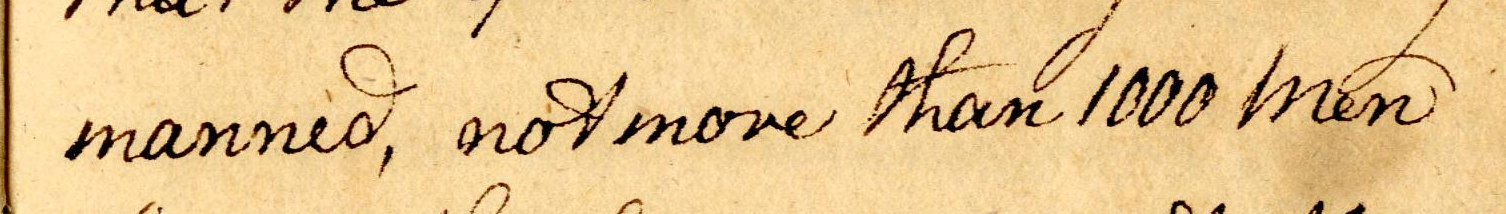manned, not more than 1000 Men
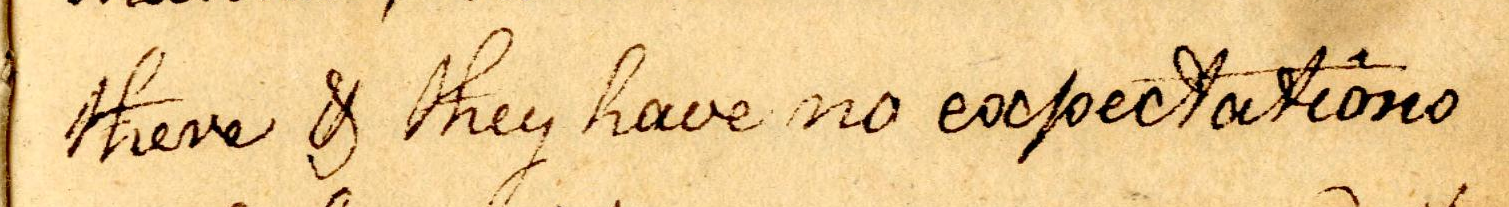there & they have no expectations
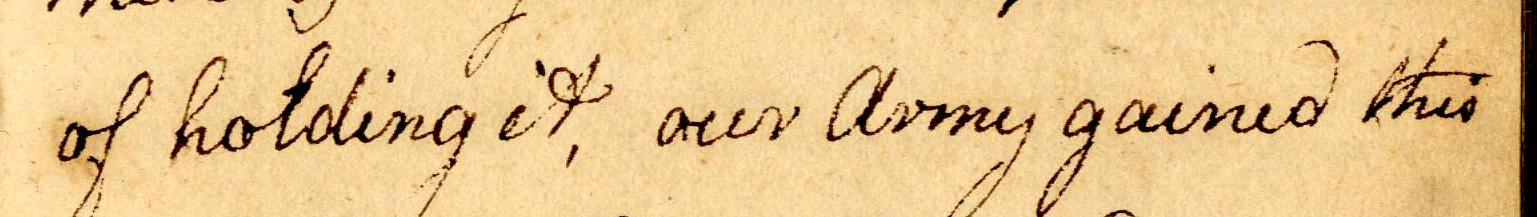of holding it, our Army gained this
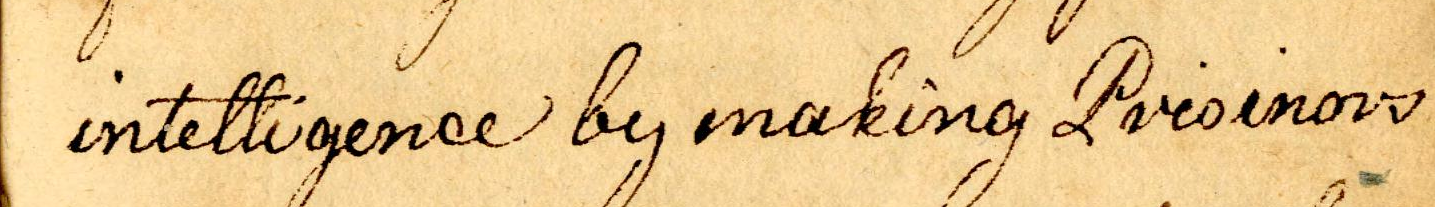intelligence by making Prisinors
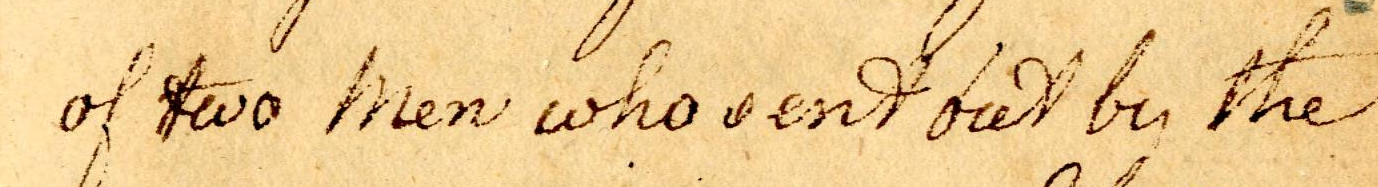of two Men who sent out by the
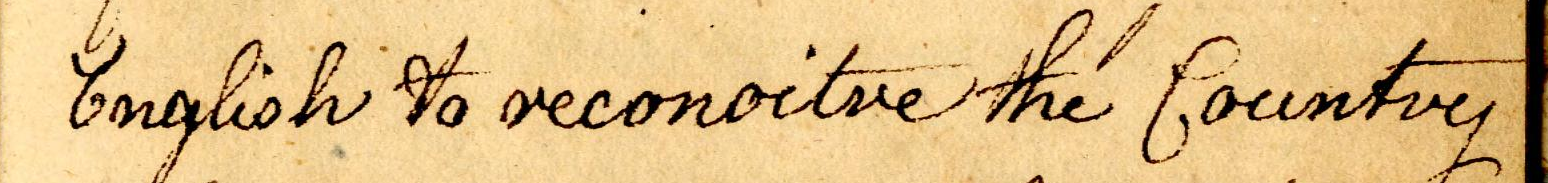English to reconoitre the Country
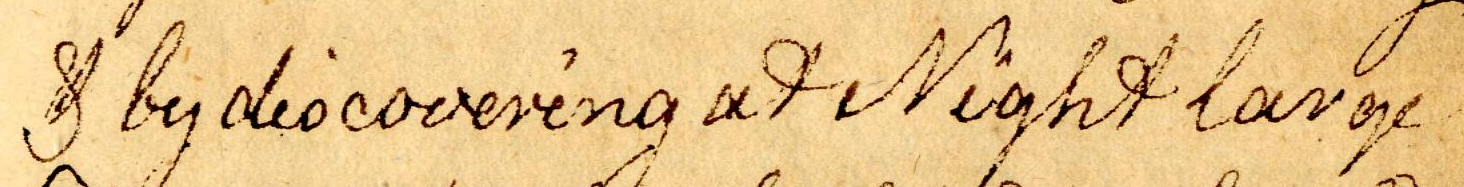& by discovering at Night large
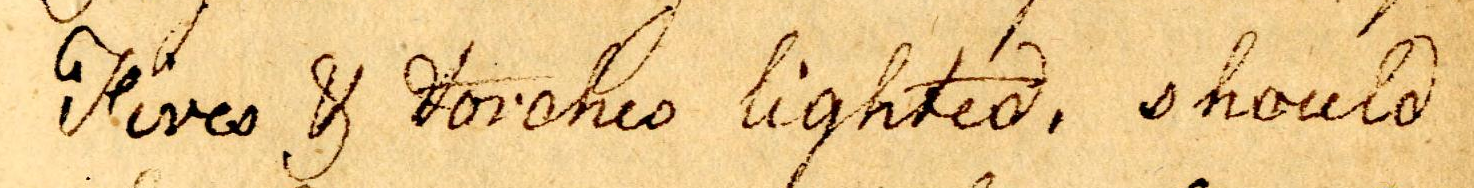Fires & torches lighted, should
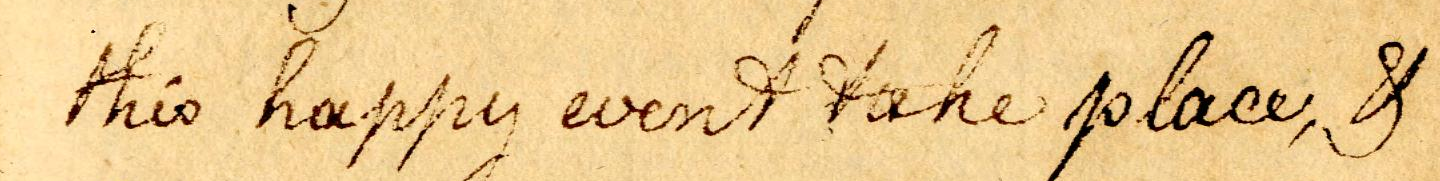this happy event take place &
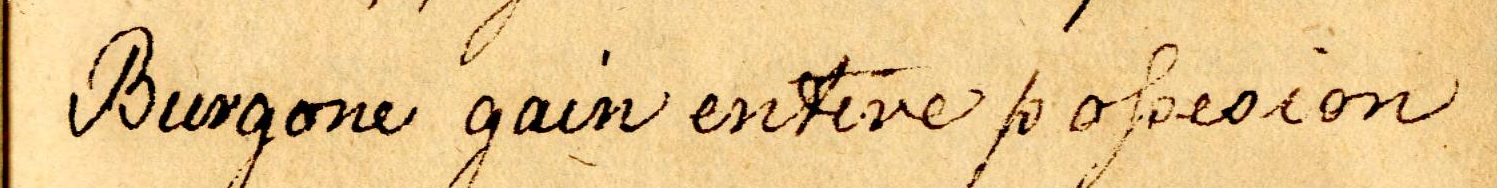Burgone gain entire possesion
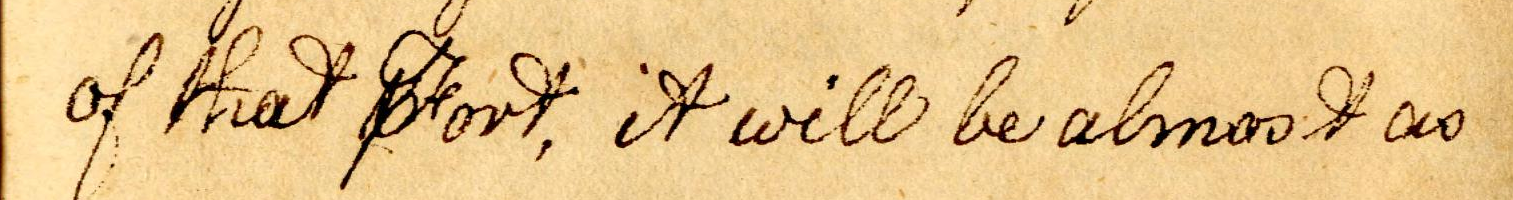of that Fort, it will be almost as
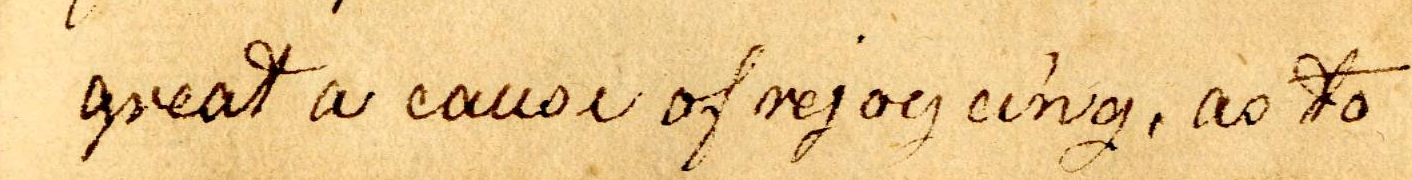great a cause of rejoycing, as to
